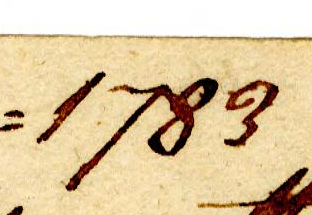1783
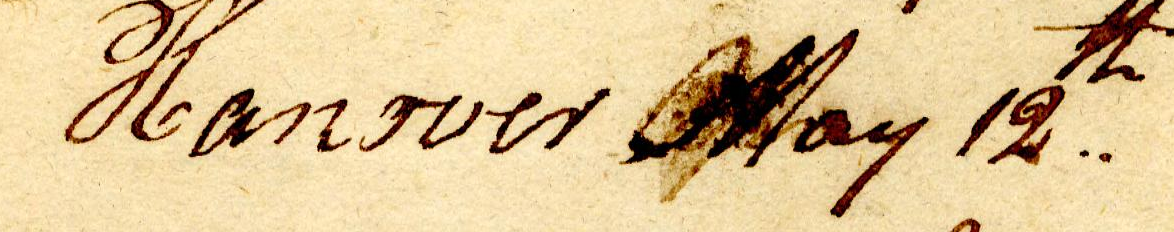Hanover May 12^th.
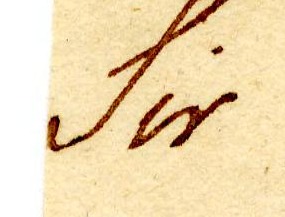Sir
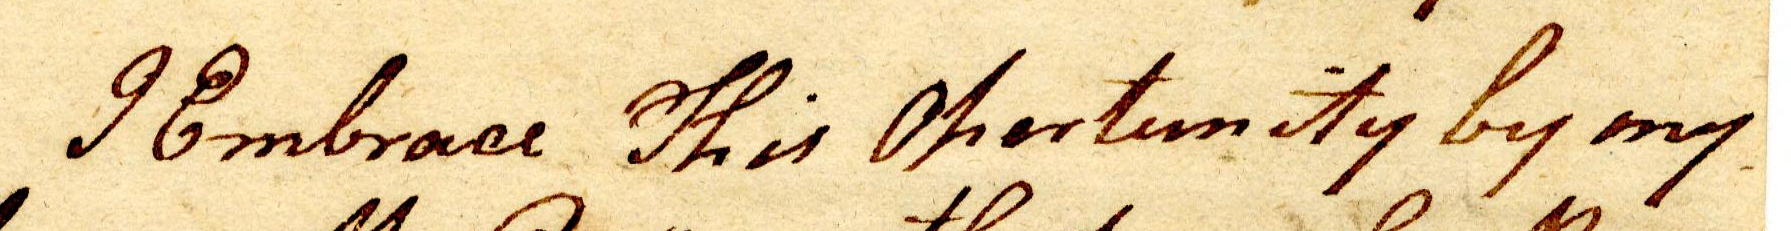I Embrace This Opertunity by my
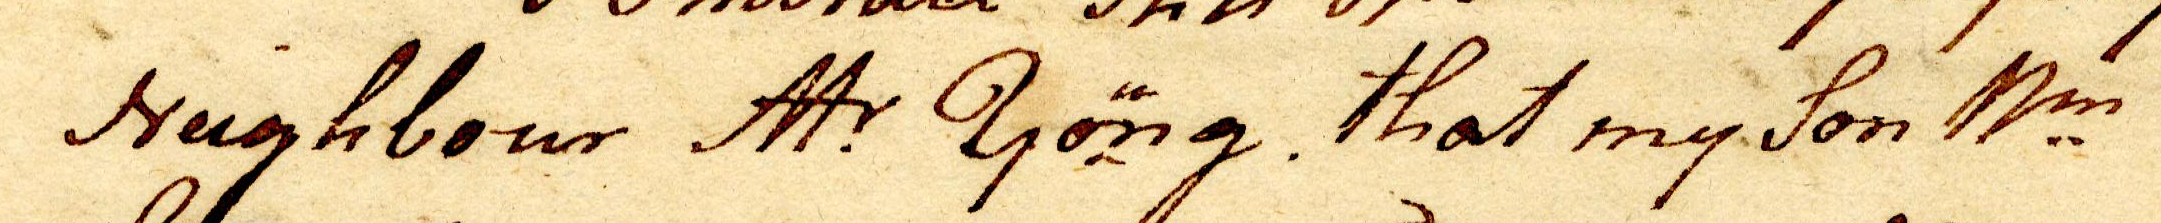Neighbour M^r. Yong that my Son W^m.
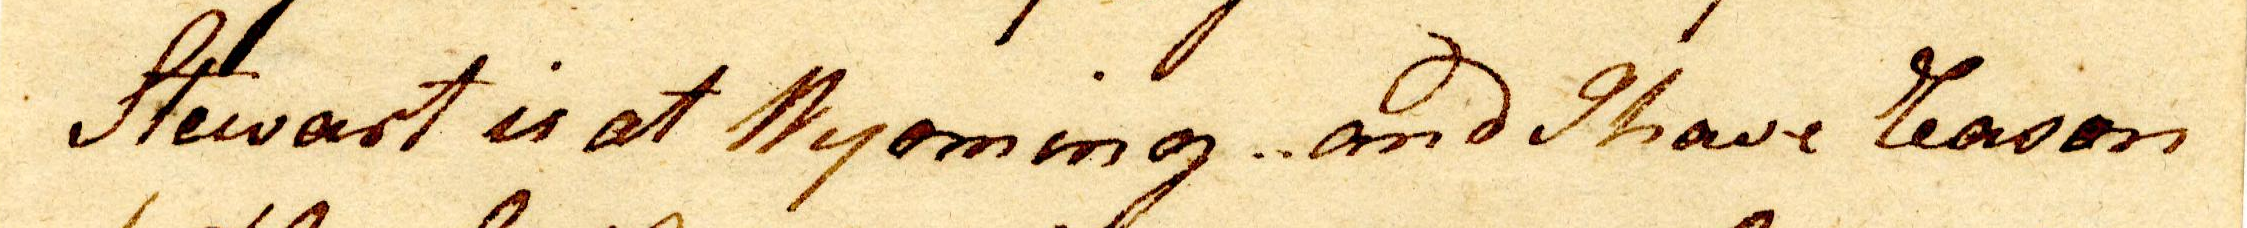Stewart is at Wyoming. and I have Reason
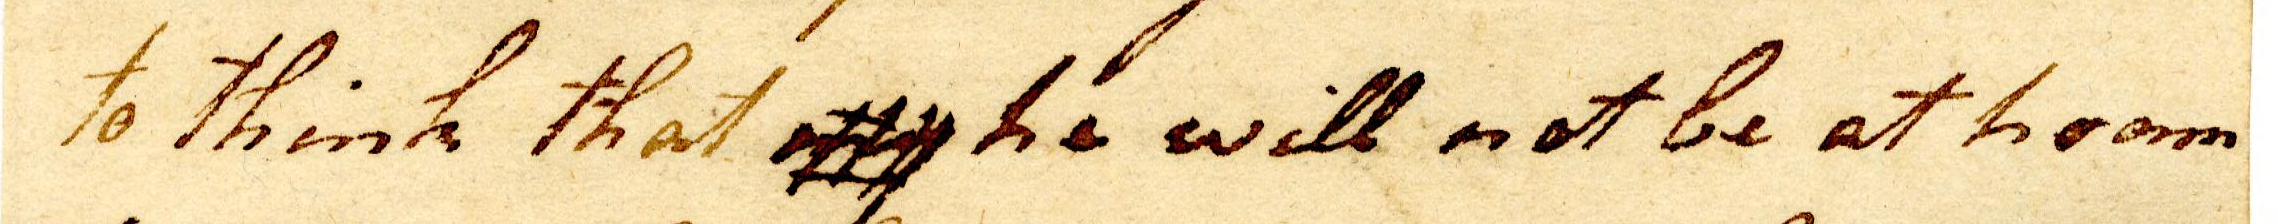to think that [atty] he will not be at hoom
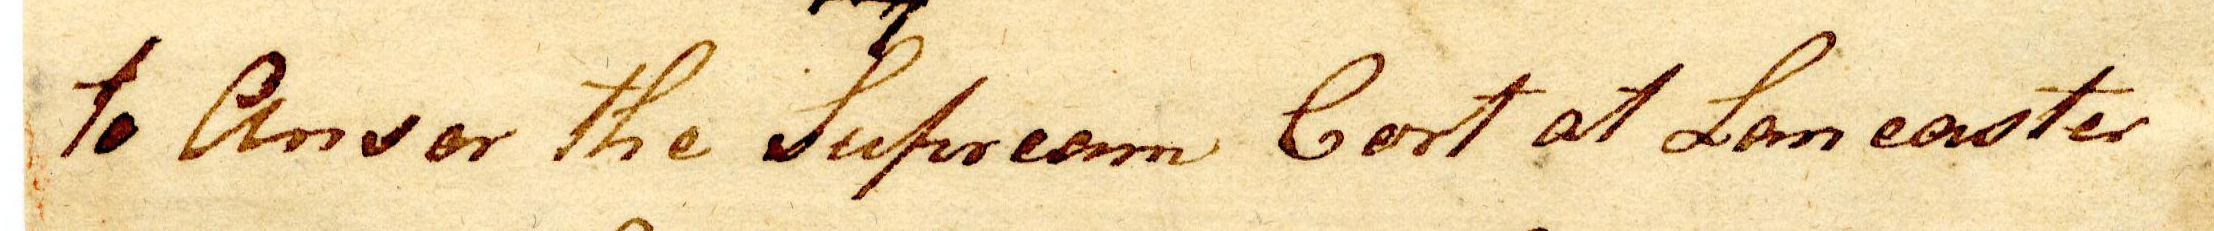To Anser the Supream Cort at Lancaster
